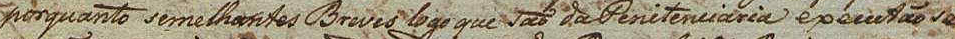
porquanto semelhantes Breves logo que são da Penitenciaria executão se
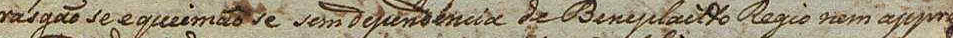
rasgão se e queimão se sem dependencia de Beneplacito Regio nem appr
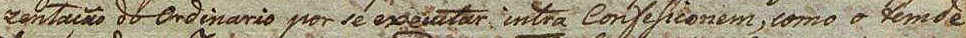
zentação do Ordinario por se executar intra Confessionem, como o tem de
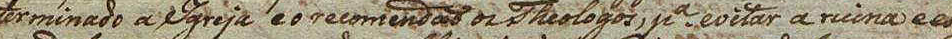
terminado a Igreja e o recomendão oz Theologos, pa. evitar a ruina e es
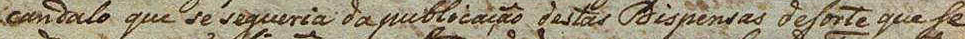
candalo que se segueria da publicação destas Dispensas de sorte que se
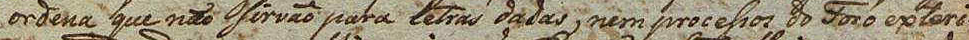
ordena que não sirvâo para letras dadas, nem processos do Foro exteri
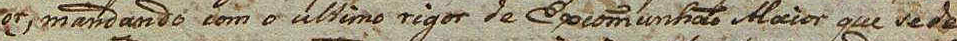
or, mandando com o ultimo rigor de Excom̄unhão Maior que se de
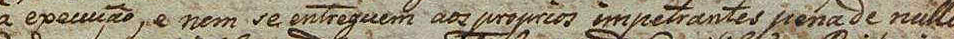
à execução, e nem se entreguem aos proprios impetrantes pena de nulli
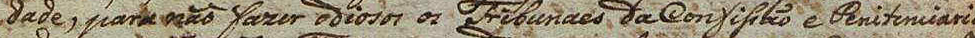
dade, para não fazer odiosos os Tribunaes da Confissaõ e Penitenciaria
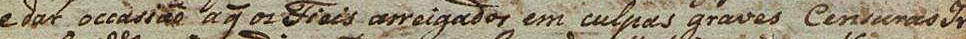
e dar occasiaõ a q̄ oz Fieis arreigados em culpas graves censuras Ir
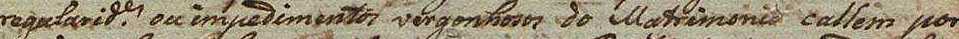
regularid.es ou impedimentos vergonhosos do Matrimonio callem por
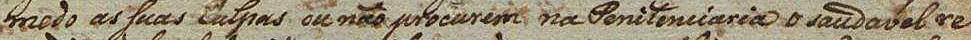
medo as suas culpas ou não procurem na Penitenciaria o saudavel re
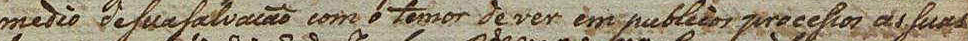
medio de sua salvacão com o temor de ver em publicos processos as suas
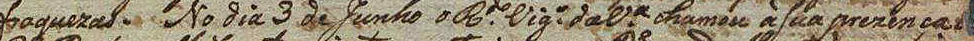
fraquezas. No dia 3 de Junho o R.do Vig.o da V.a chamou à sua prezença_
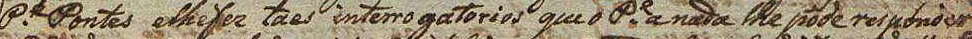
P.e Pontes e lhe fez taes interrogatorios que o P.e a nada lhe pôde responder
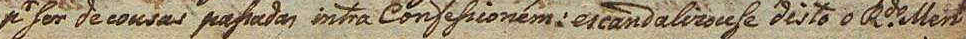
pr ser de cousas passadas intra confessionem: escandalizouse disto o R.do Men.o
